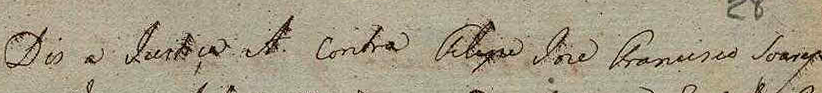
Dis a Justiça A. contra Filipe Ioze Francisco Soares
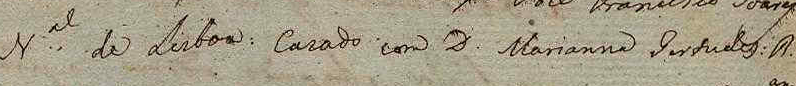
N.al de Lisboa cazado com D. Marianna Gertudes: R.
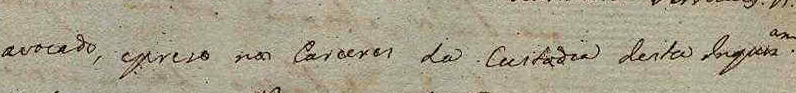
avocado, e prezo nos Carceres da Custodia desta Inquiz.am
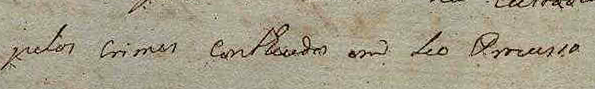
pelos crimes contheudos em seo Proccesso
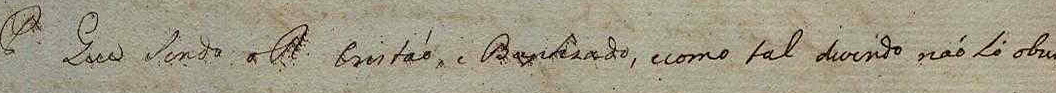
P. Que sendo o R. Cristaõ e Baptizado, e como tal devendo naõ só obser
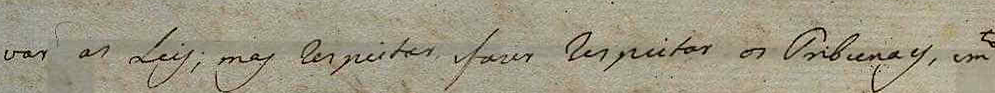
var as Leis; mas Respeitar e fazer Respeitar os Tribunaes, e m.to
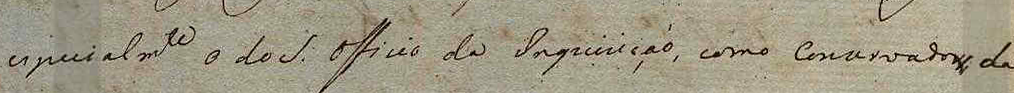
especialm.te o do S. officio da Inquiziçaõ, como conservador, da
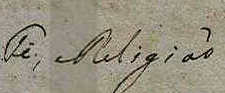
Fé, e Religiaõ
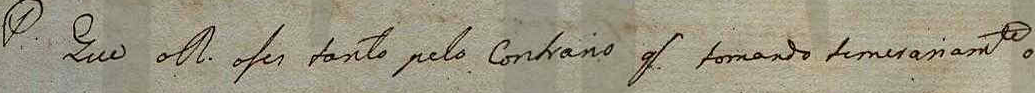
P. Que o R. o fes tanto pelo Contrario q̄ tomando temerariam.te o
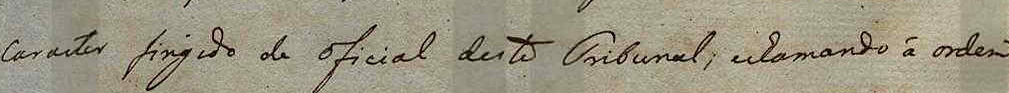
caracter fingido de oficial deste Tribunal, e chamando á ordem
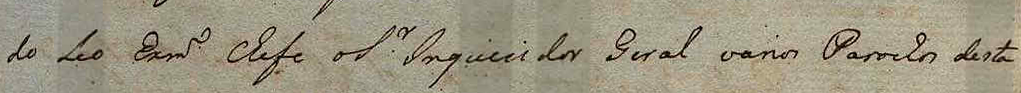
do seo Exm.o chefe o S.r Inquizidor Geral varios Parochos desta
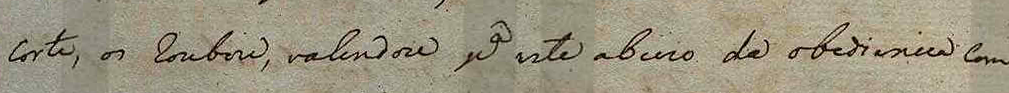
corte, os Roubou, valendoze p.a este abuzo da obediencia com
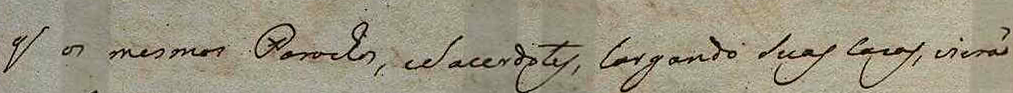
q̄ os mesmos Parochos, e Sacerdotes, largando suas cazas, vieraõ
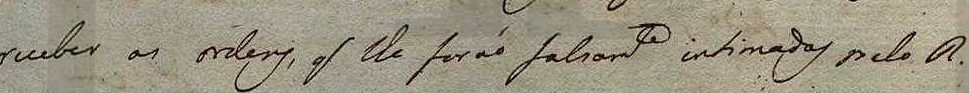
receber as ordens, q̄ lhe foraõ falsam.te intimados pelo R.
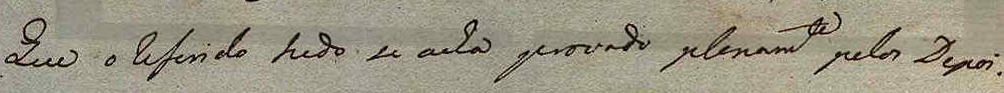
Que o Referido tudo se acha provado plenam.te pelos Depoi
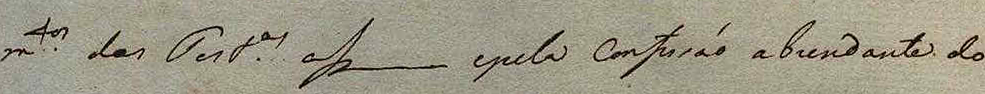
m.tos das Test.as a f____ e pela confissaõ abundante do
